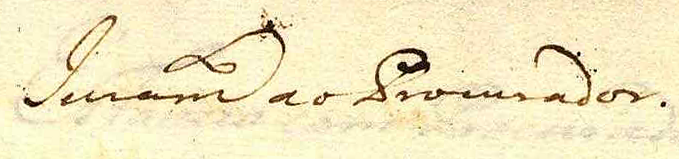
Iuram.to ao Procurador.
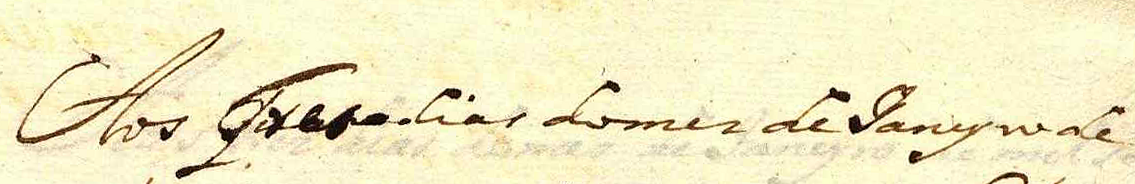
Aos Trese dias do mes de Ianeyro de
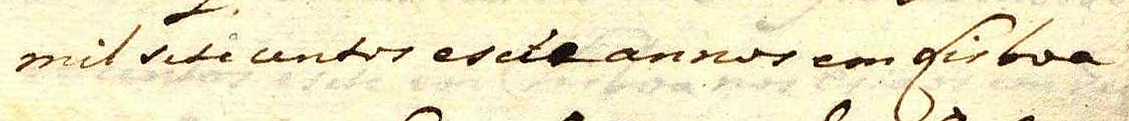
mil setecentos e sete annos em Lisboa
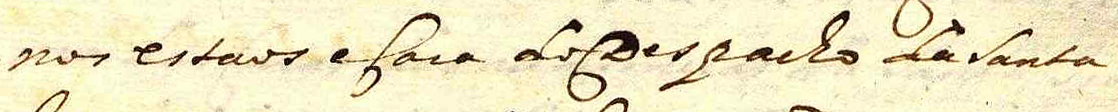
nos estaos e Caza do Despacho da Santa
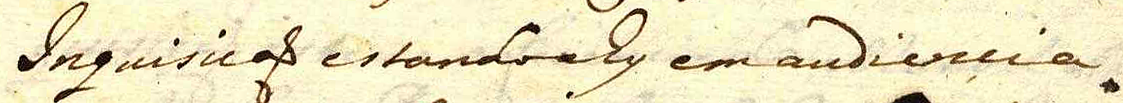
Inquisiçaõ estando ahy em audiencia
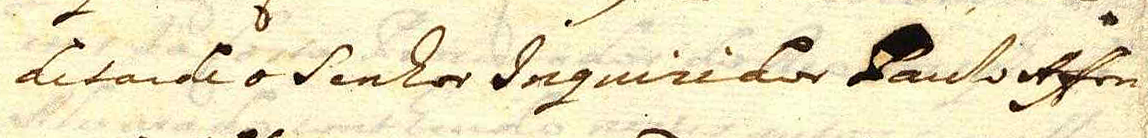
de tarde o Senhor Inquizidor Paulo Affon
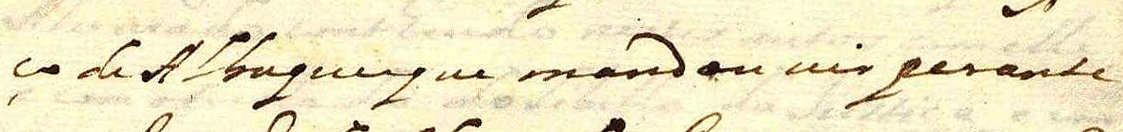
ço de Albuquerque mandou uir perante
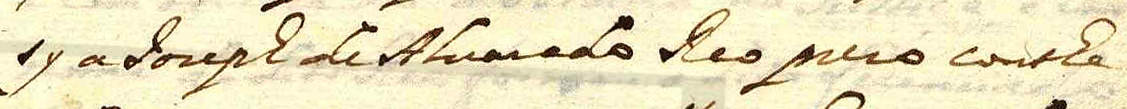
sy a Iozeph de Aluarado Reo prezo conthe
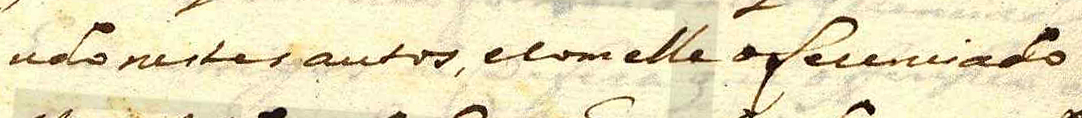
udo nestes autos, e com elle o Lecenciado
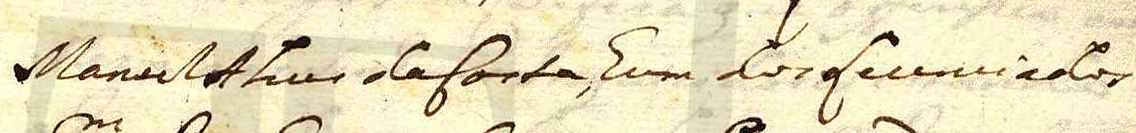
Manoel Alues da Costa, hum dos Lecenciados
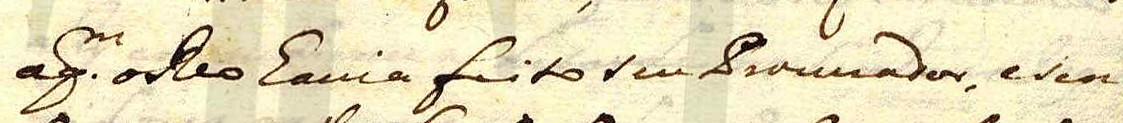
a q.m o Reo hauia feito seu Procurador, e sen
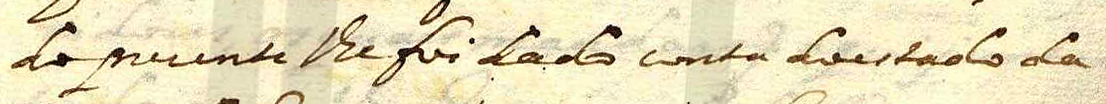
do prezente lhe foi dado conta do estado da
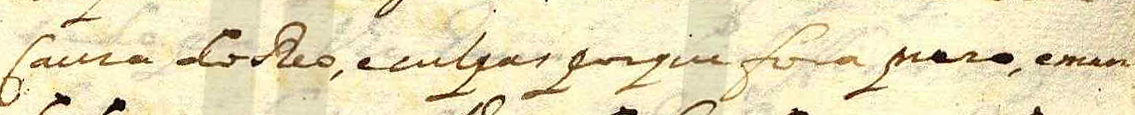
Cauza do Reo, e culpas porque fora prezo, e man
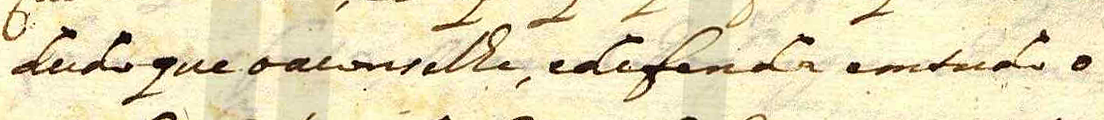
dado que o aconselhe, e defenda em tudo o
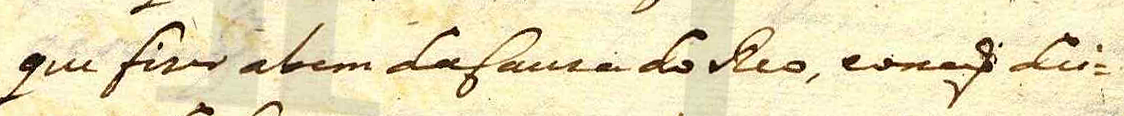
que fizer a bem da Cauza do Reo, e o naõ dei
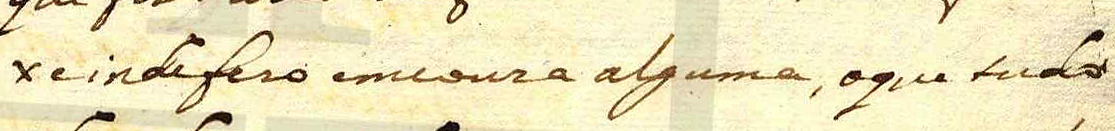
xe indefezo em couza alguma, o que tudo
